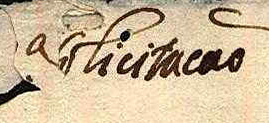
a_olicitaçaõ
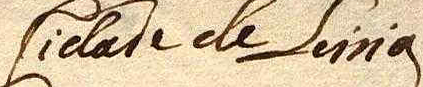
Cidade de Leiria
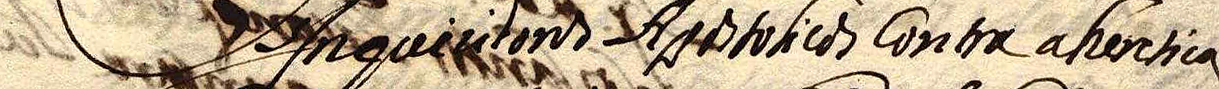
Os Jnquizidores Apotolicos contra a hertica
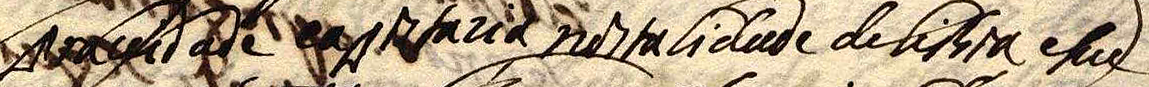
Prauidade e apostazia nesta Cidade de Lisboa e seu
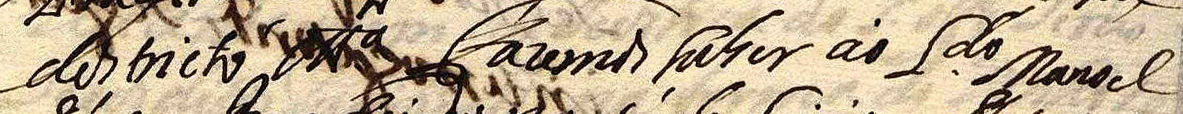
destricto etta Fazemos saber ao L.do Manoel
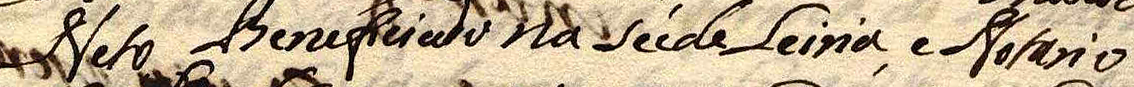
Neto Beneficiado na seé de Leiria e Notario
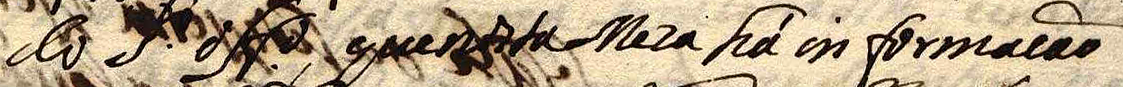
do Sto off.o que desta Meza há informaçaõ
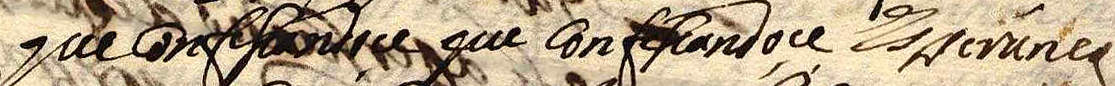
que confessandoçe que confessandoçe Esperánça
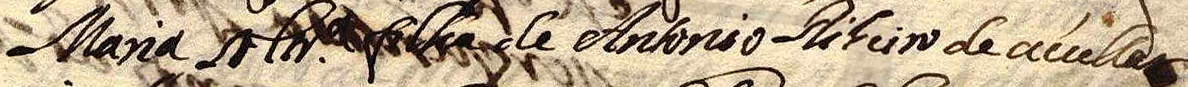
Maria soltr.a filha de Antonio Ribeiro de auellar
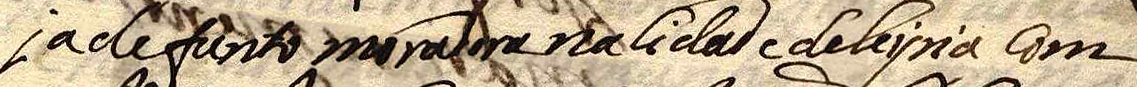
ja defunto moradora na Cidade de leyria com
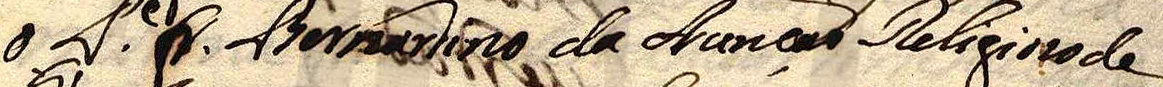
o P.e fr. Bernardino da Asunção Religiozo de
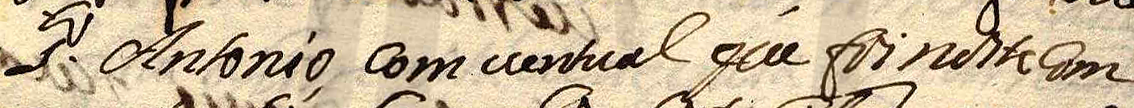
S.to Antonio, com uentual que foi neste com
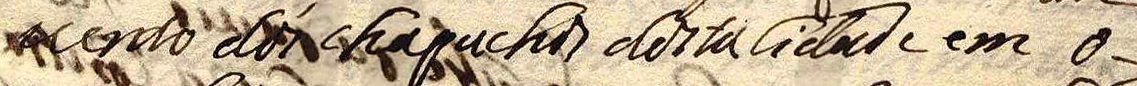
uento dos chapuchos desta Cidade em o
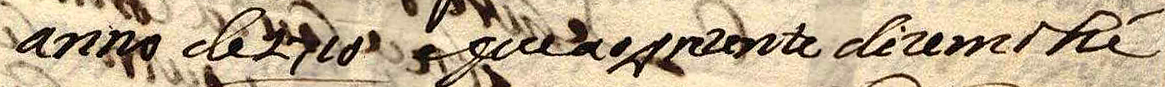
anno de 1710 o que ao prezente dizem o hé
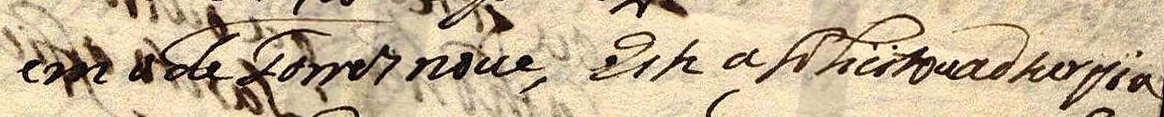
em o de Torres noue, Este a solicitou ad turpia
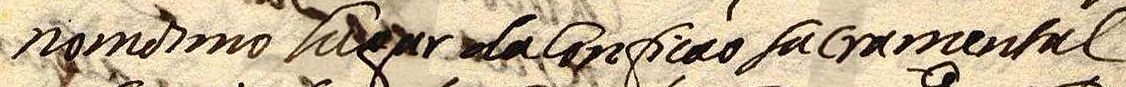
no mesmo lugar da Confiçaõ sacramental
